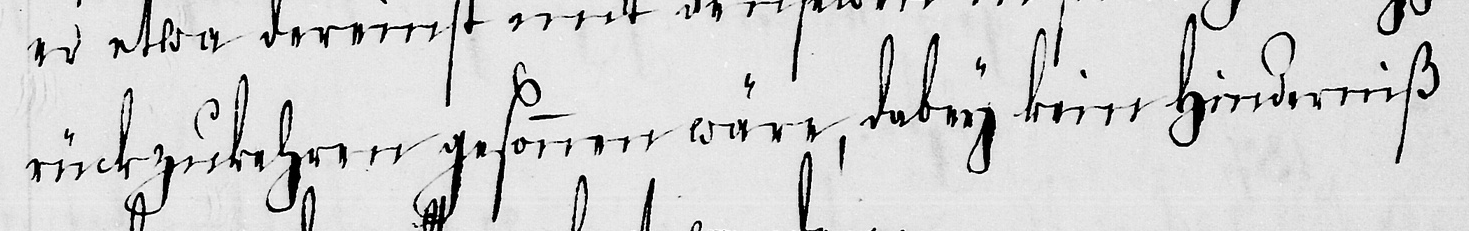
rückzukehren gesonnen wäre, dabey kein Hinderniß
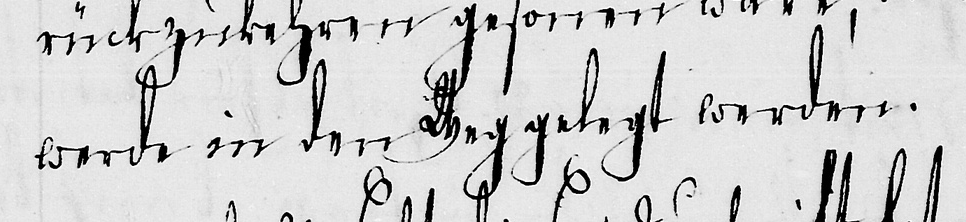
werde in den Weg gelegt werden.
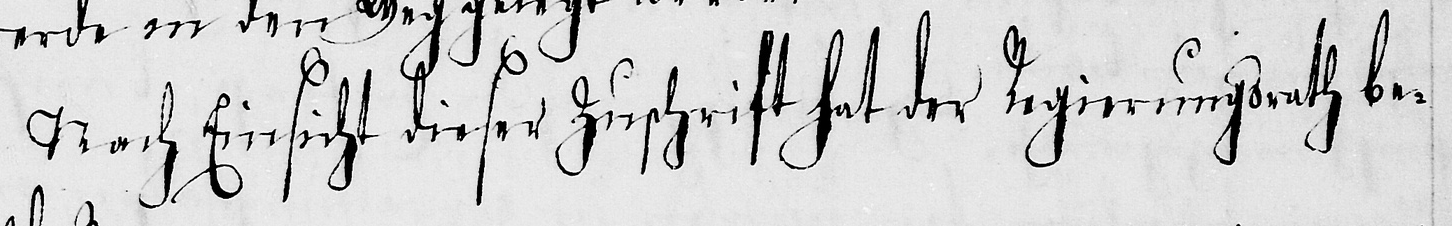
Nach Einsicht dieser Zuschrift hat der Regierungsrath be¬
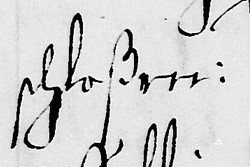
schloßen:
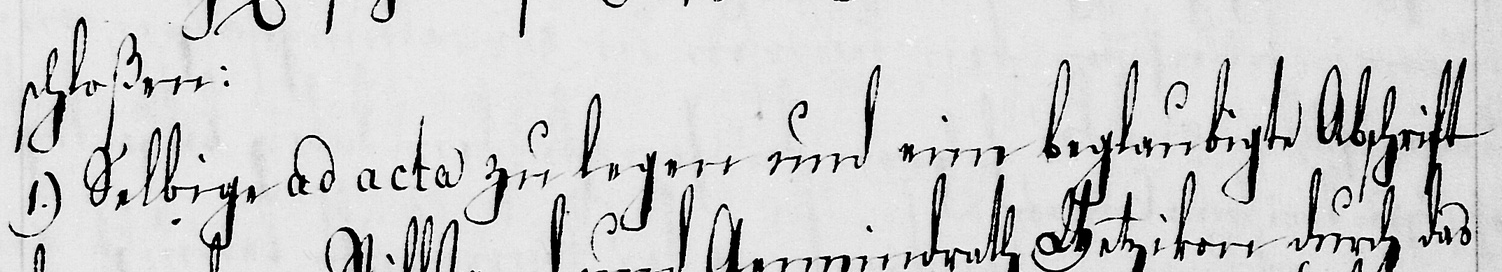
Selbige ad acta zu legen und eine beglaubigte Abschri¬
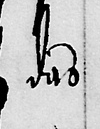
das
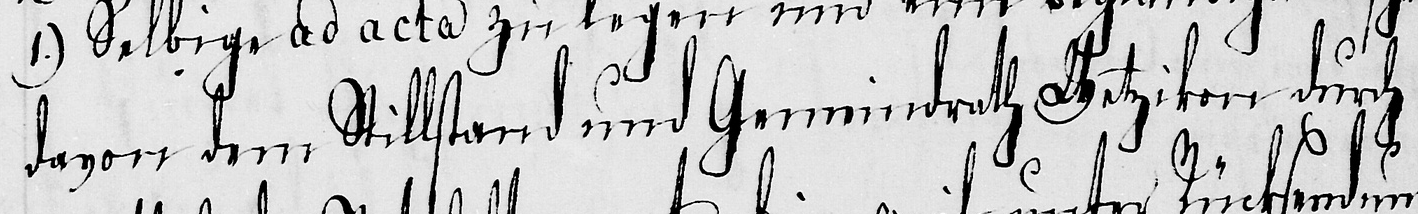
davon dem Stillstand und Gemeindrath Wetzikon durch
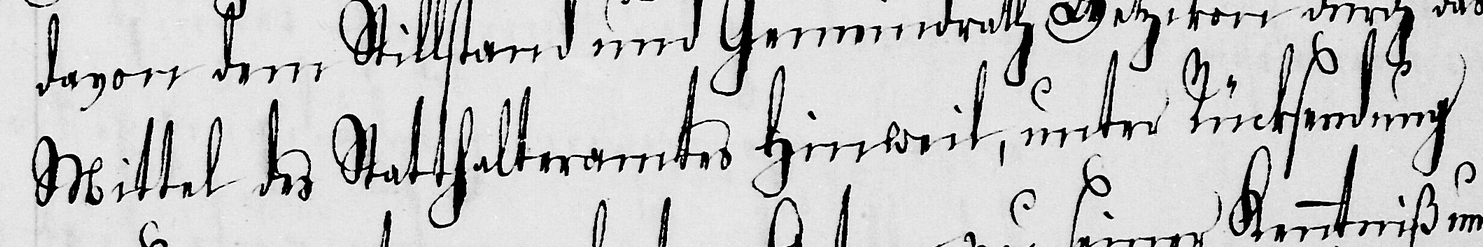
Mittel des Statthalteramtes Hinweil, unter Rücksendung
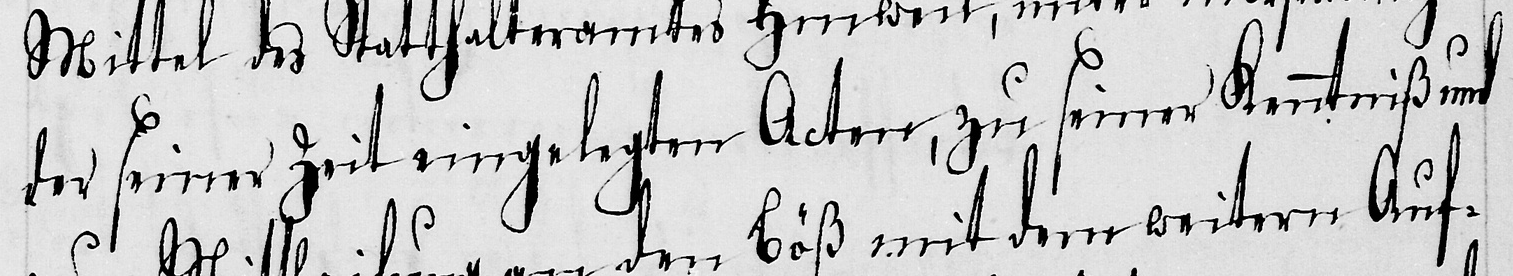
der seiner Zeit eingelegten Acten, zu seiner Kenntniß und
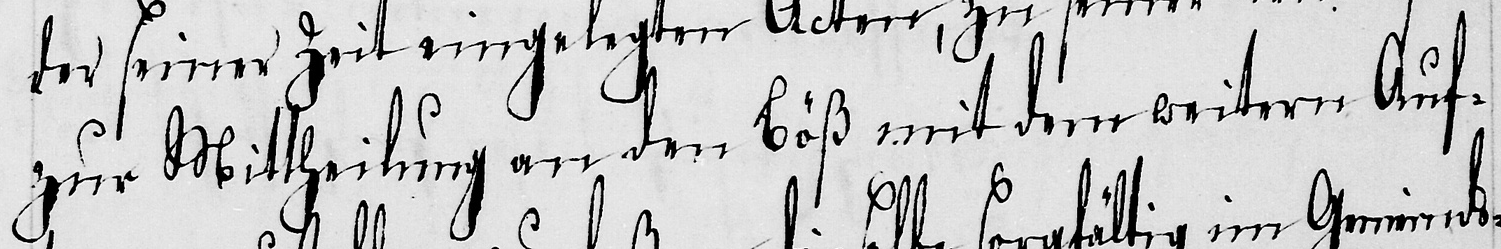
zur Mittheilung an den Böß mit dem weitern Auf¬
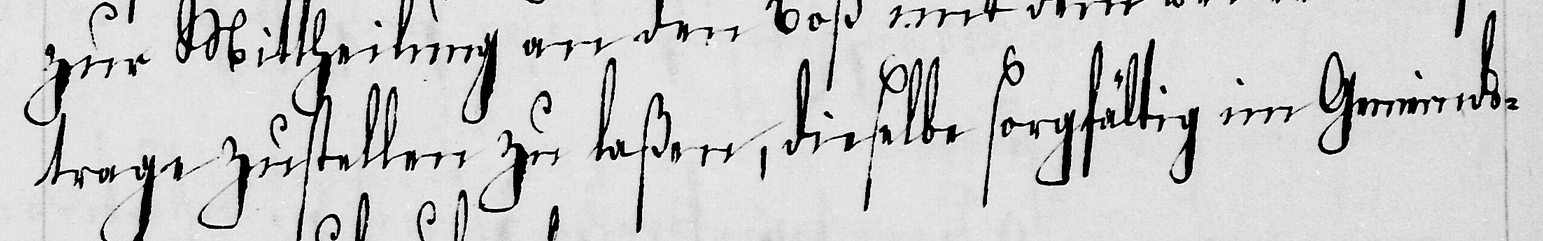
trage zustellen zu laßen, dieselbe sorgfältig im Gemeind¬
